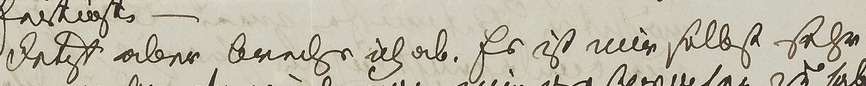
Jetzt aber breche ich ab. Es ist mir selbst sehr
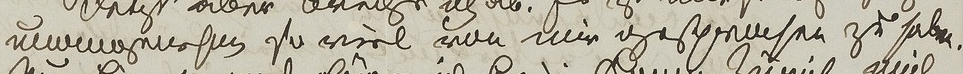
unangenehm, so viel von mir gesprochen zu haben.
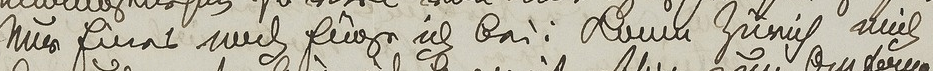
Nur Eines noch füge ich bei: Kann Zürich mich
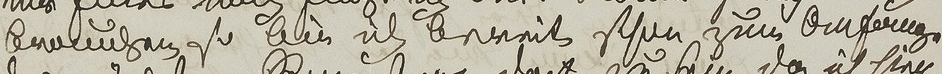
brauchen, so bin ich bereit, schon zum Anfange
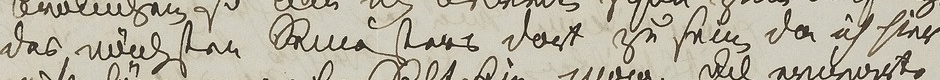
des nächsten Semesters dort zu sein, da ich hier
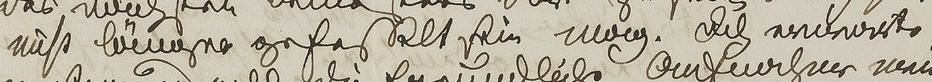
nicht länger gefeßelt sein mag. Ich erwarte
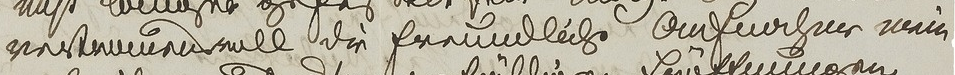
vertrauensvoll die freundliche Aufnahme mei-
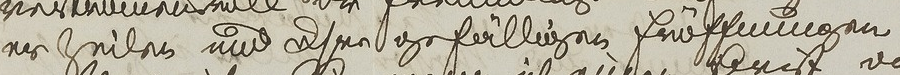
ner Zeilen und Ihre gefälligen Eröffnungen.
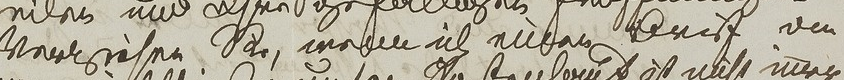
Verzeihen Sie, wenn ich einen Brief an
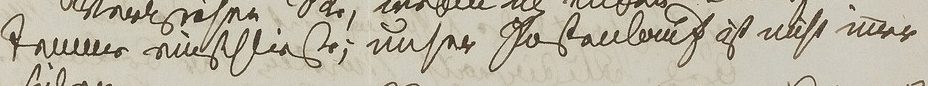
Temme einschließe; unser Postenlauf ist nicht immer
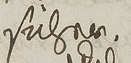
sicher.
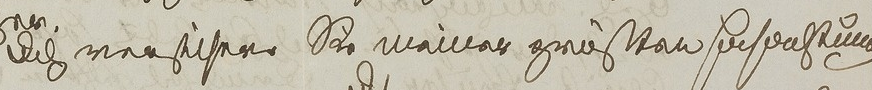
Ich versichere Sie meiner größten Hochachtung
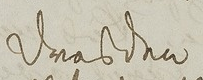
Dresden
